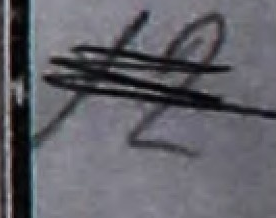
12
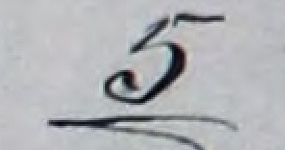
5
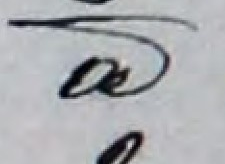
a
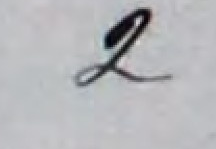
2
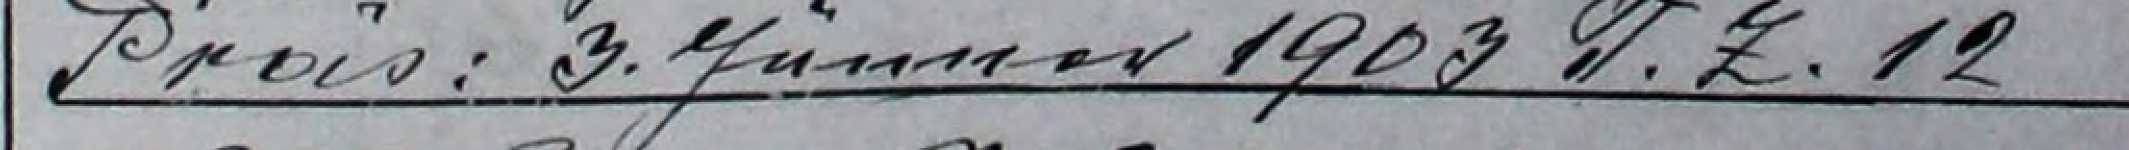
Präs: 3. Jänner 1903 T.Z. 12
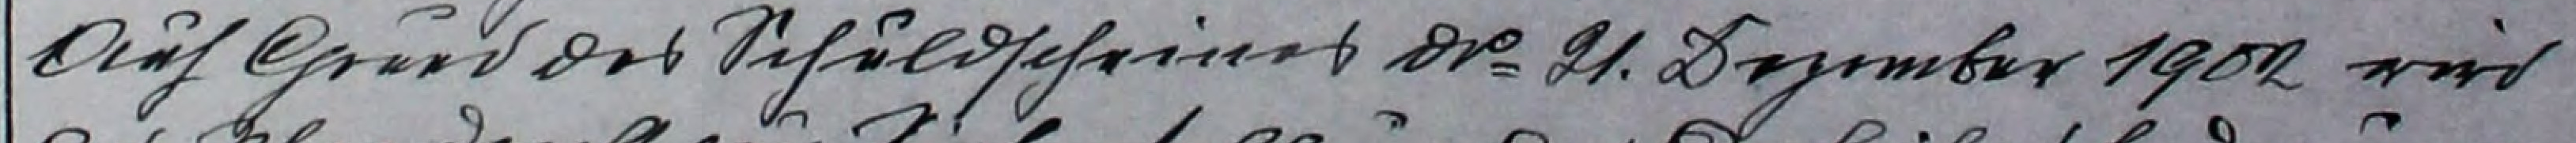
Auf Grund des Schuldscheines ddo 21. Dezember 1902 wird
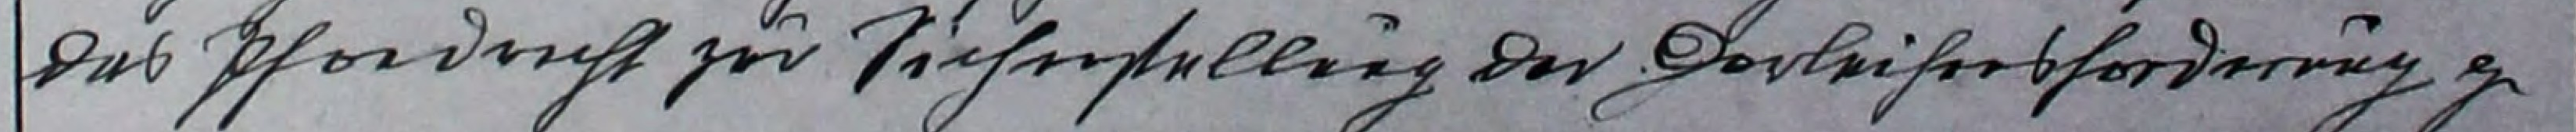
des Pfandrecht zur Sicherstellung der Darleihensforderung pr ./.
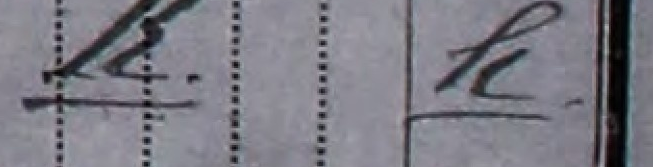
K. h.
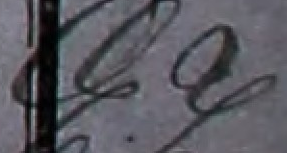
600 -
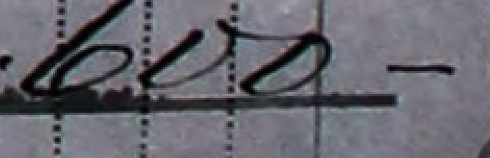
E.Z
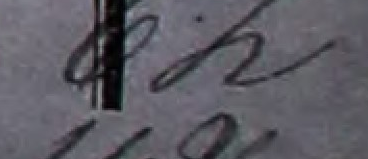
?. h
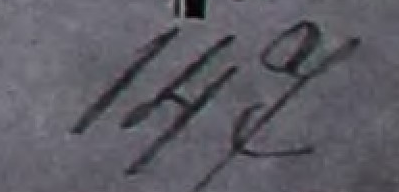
147
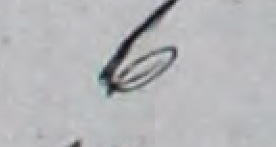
6
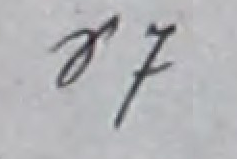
S 7
